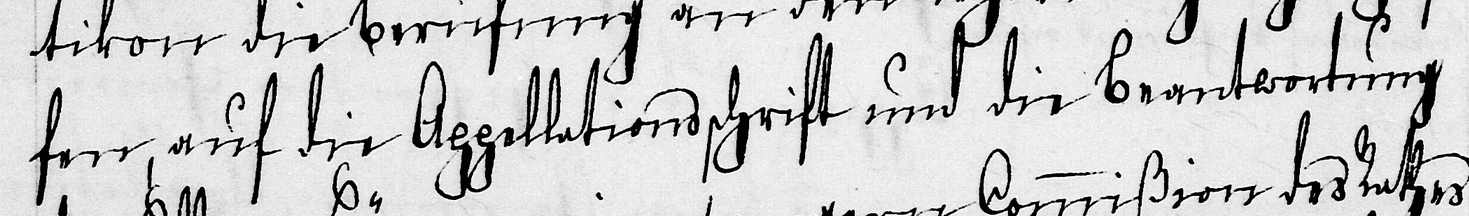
fen, auf die Appellationsschrift und die Beantwortung
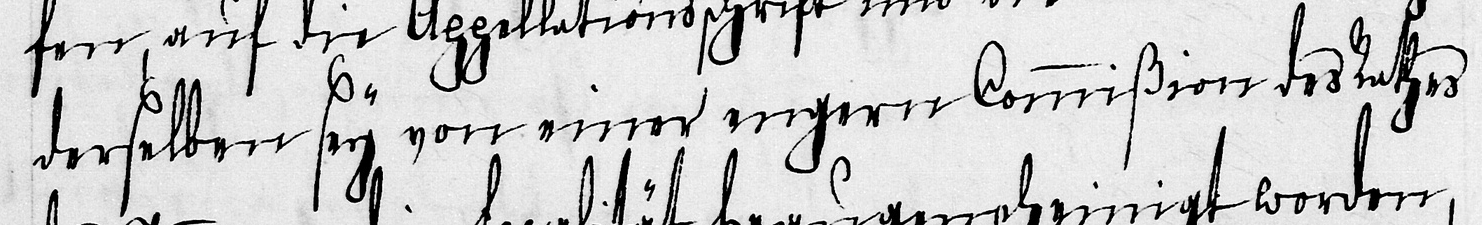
derselben sey von einer engern Commißion des Rathes
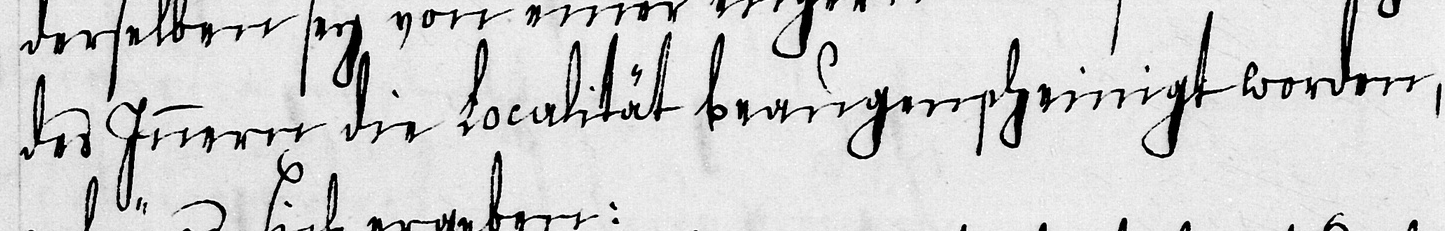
des Innern die Localität beaugenscheinigt worden,
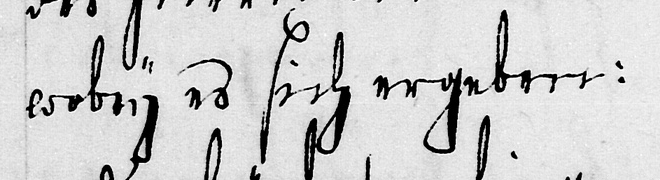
wobey es sich ergeben:
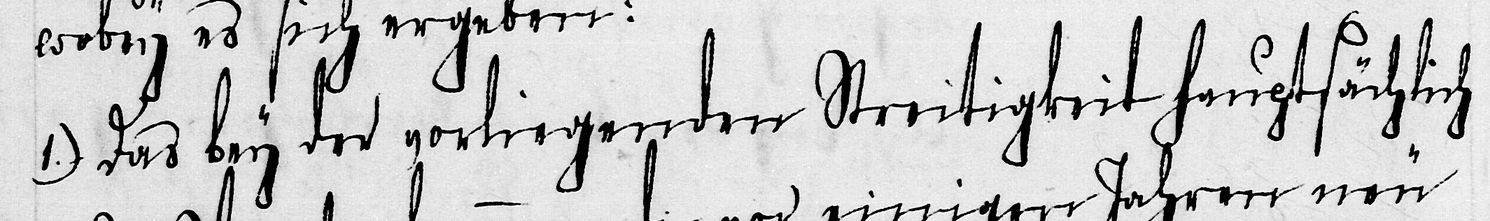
1.) Daß bey der vorliegenden Streitigkeit hauptsächlich
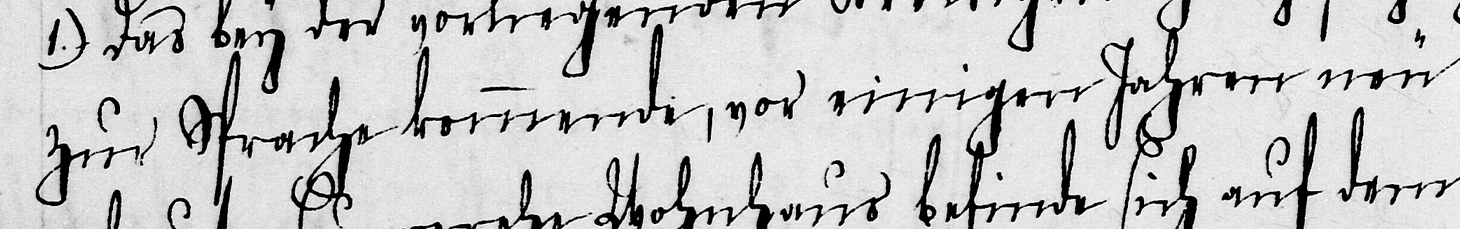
zur Sprache kommende, vor einigen Jahren neu
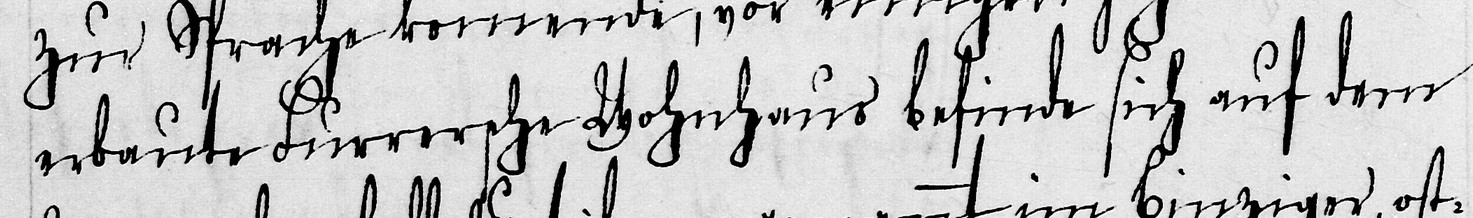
erbaute Furrersche Wohnhaus befinde sich auf dem
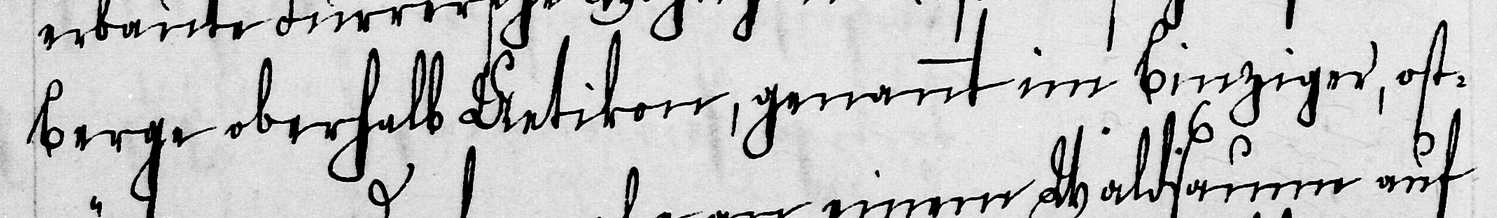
Berg oberhalb Uetikon, genannt im Binziger, ost¬
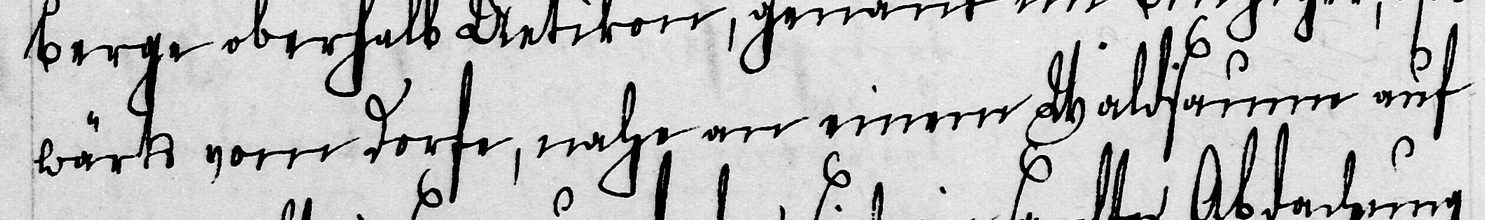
wärts vom Dorfe, nahe an einem Waldsaume auf
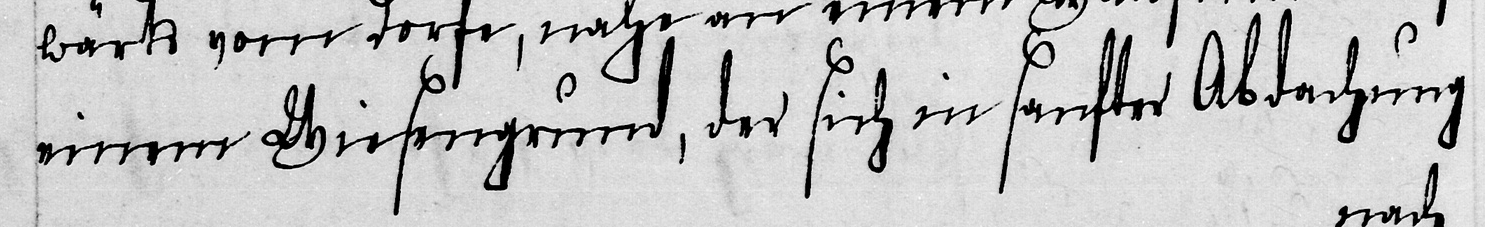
einem Wiesengrund, der sich in sanfter Abdachung
